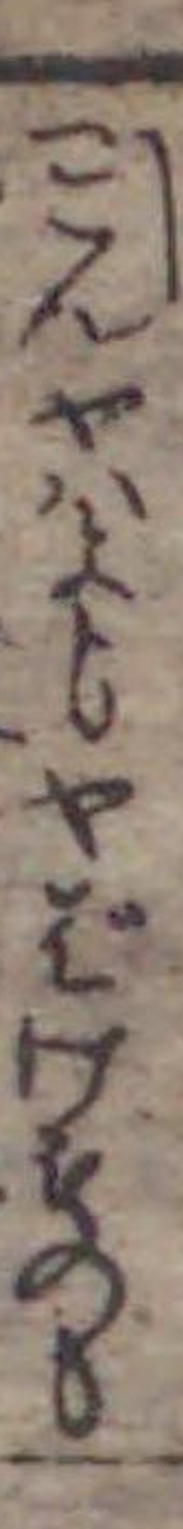〽こんやはよもやばけものも
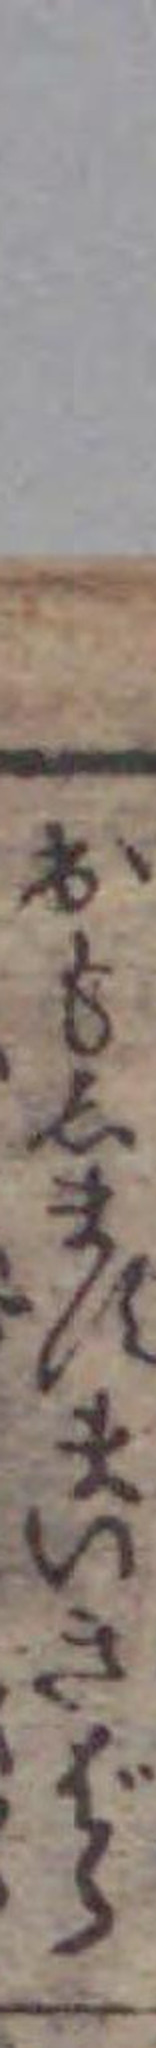出もしますまいきばら
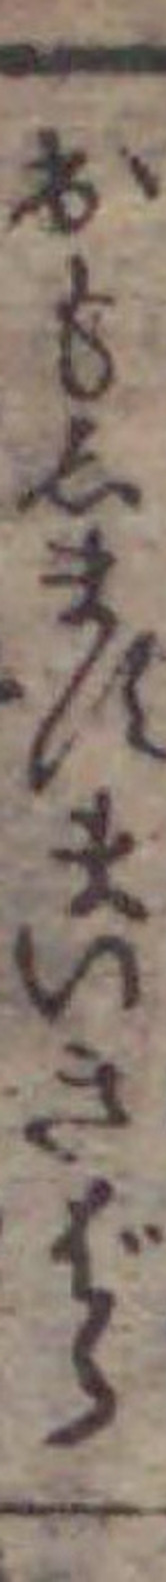出もしますまいきばら
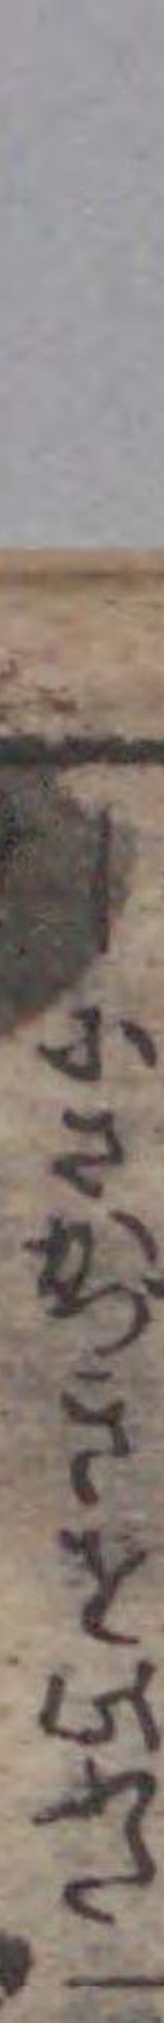しにさかづきを此ふた
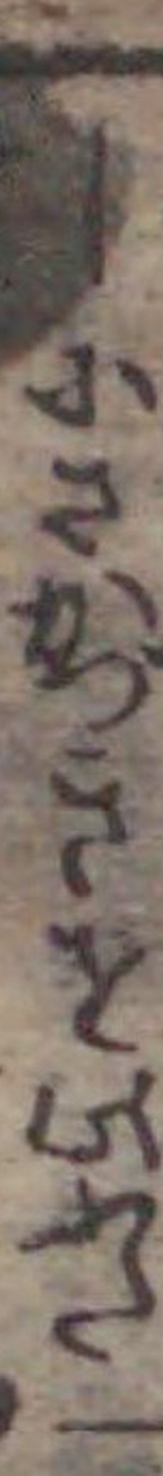しにさかづきを此ふた
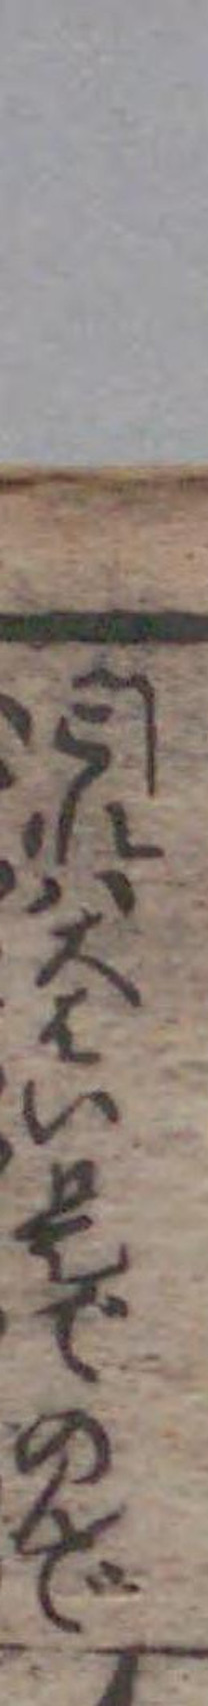〽これは大はい是でのんで
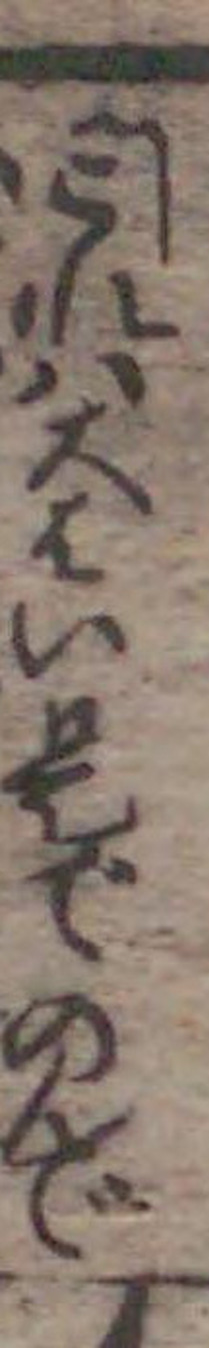〽これは大はい是でのんで
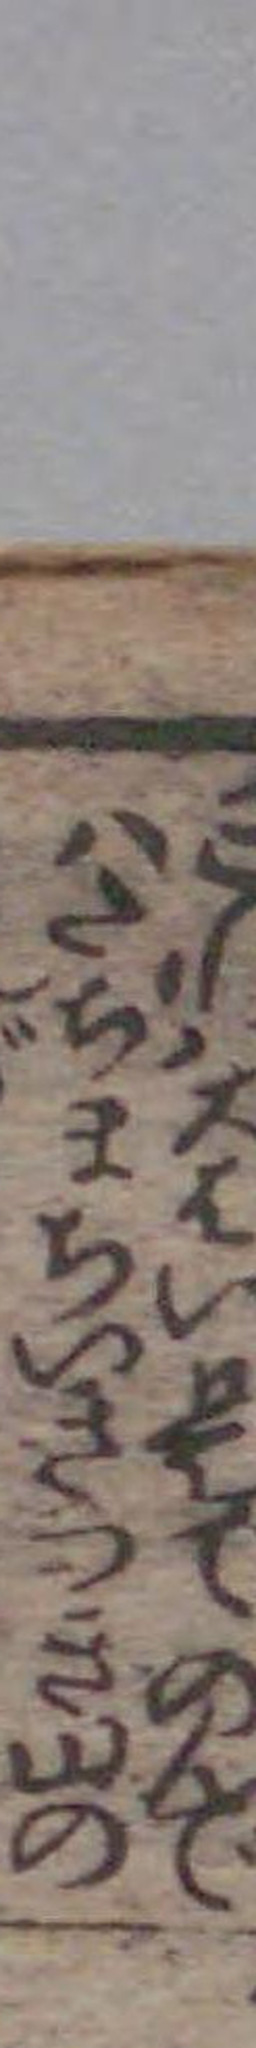はたちまちいきつき山の
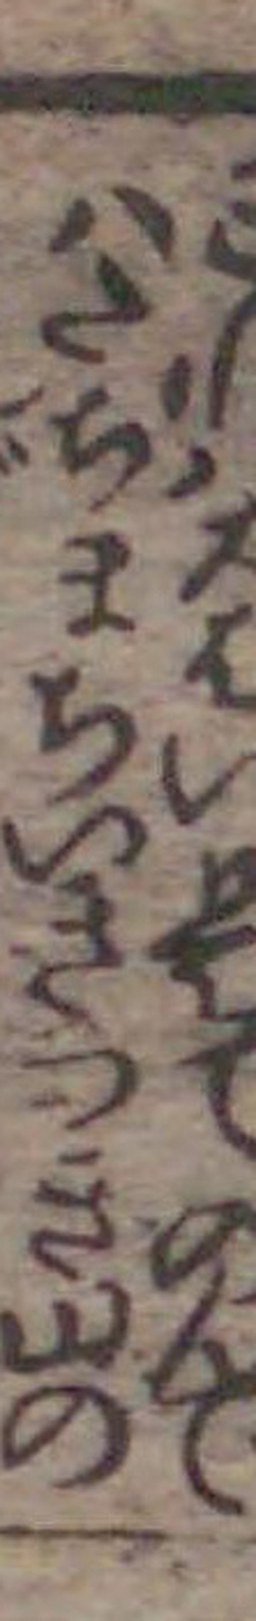はたちまちいきつき山の
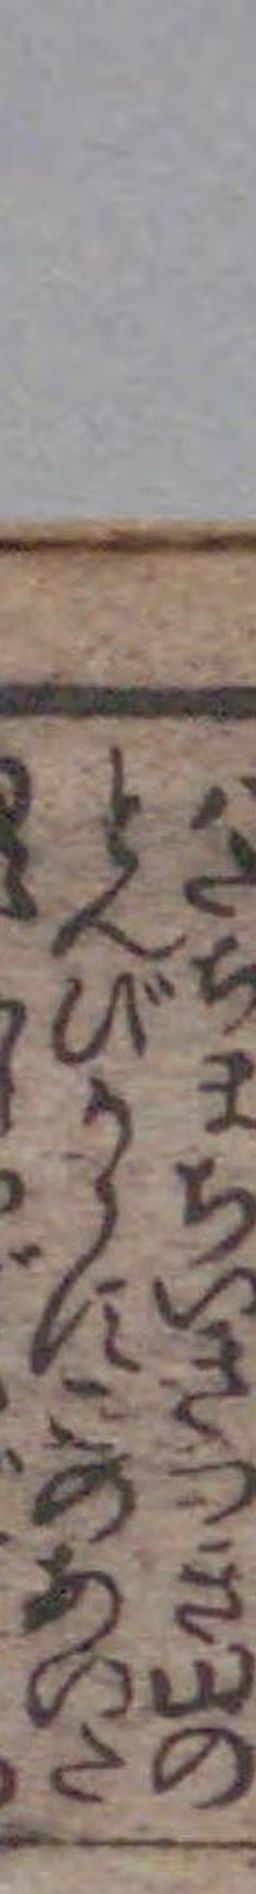とんびからすこのあいた

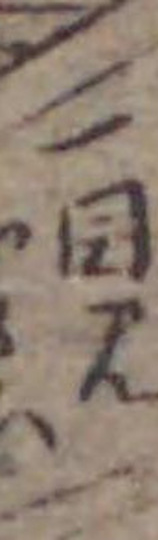一目見
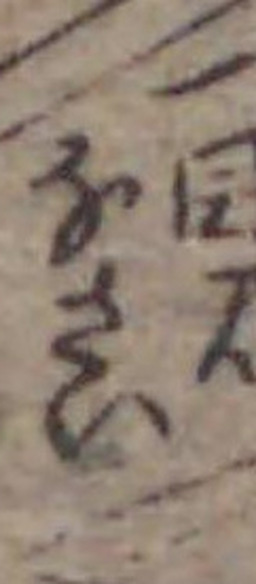なさい
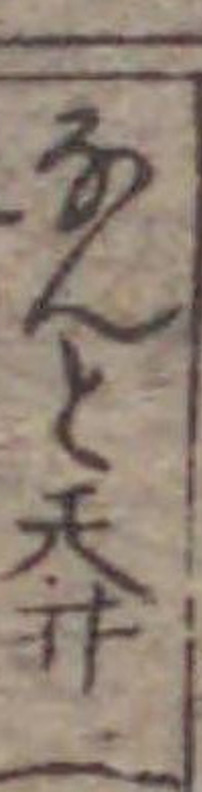なんと天井
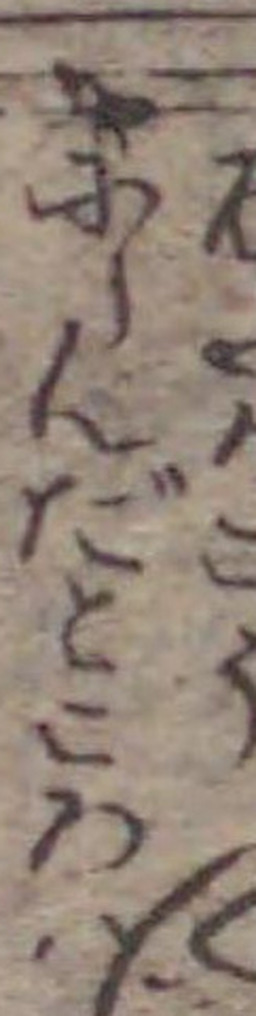にらんだところは
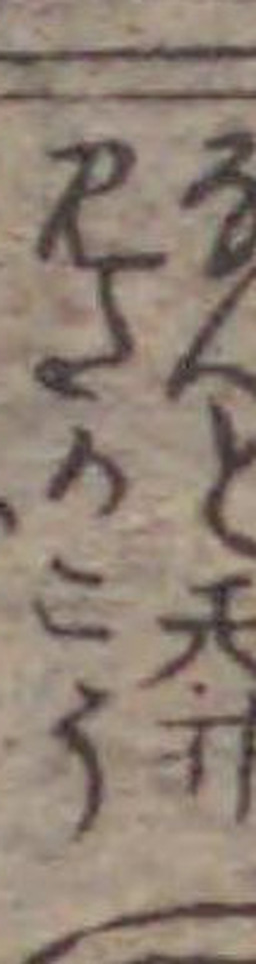見たかこう
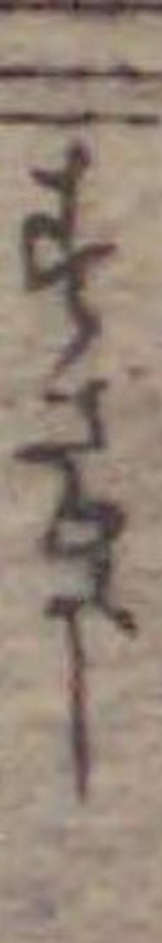すさまし
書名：辞闘戦新根 （国会）
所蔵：国立国会図書館 National Diet Library, JAPAN
